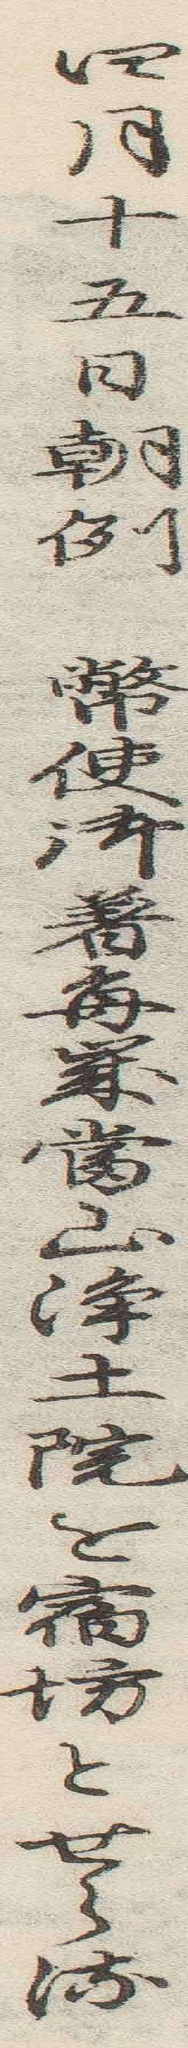四月十五日朝例幣使御着每歳當山浄土院を宿坊とせらる
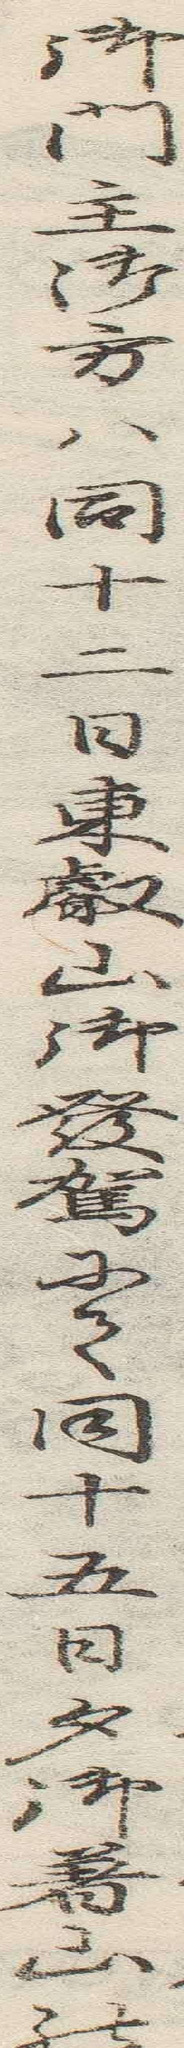御門主御方は同十二日東叡山御發駕にて同十五日夕御着山の
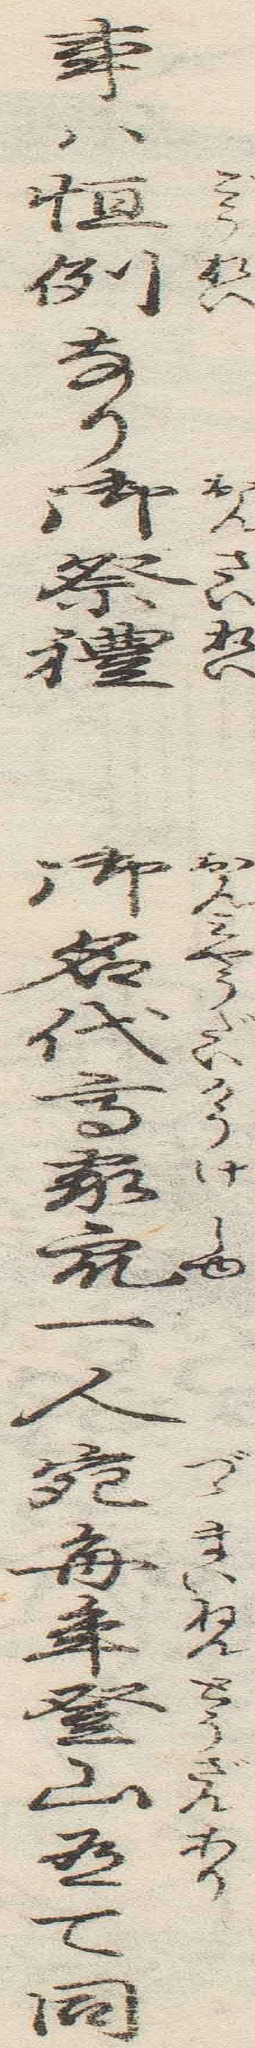事は恒例なり御祭禮御名代高家衆一人宛毎年登山有て同
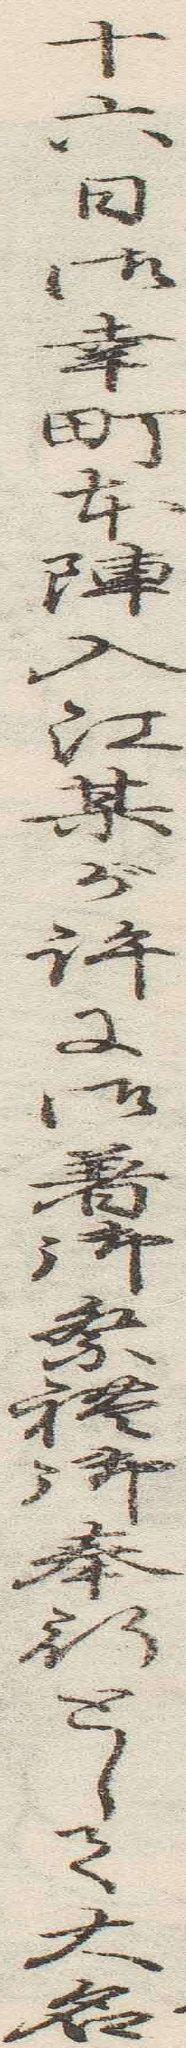十六日御幸町本陣入江某が許に御着御祭禮御奉行として大名
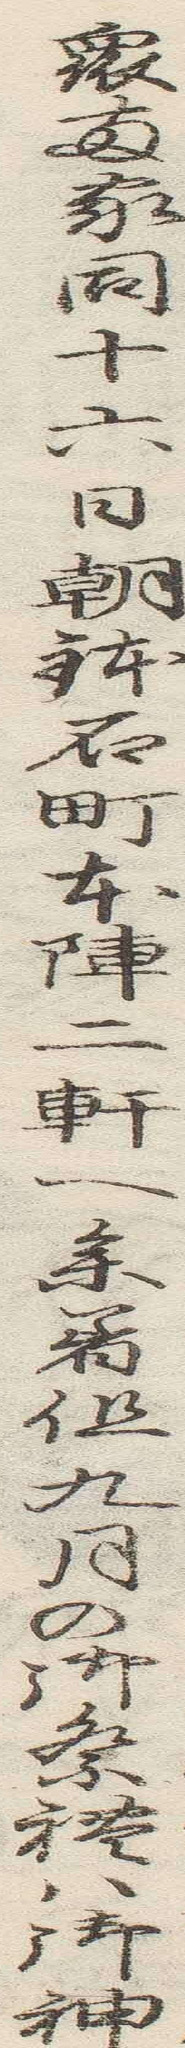衆両家同十六日朝鉢石町本陣二軒へ参着但九月の御祭禮は御神
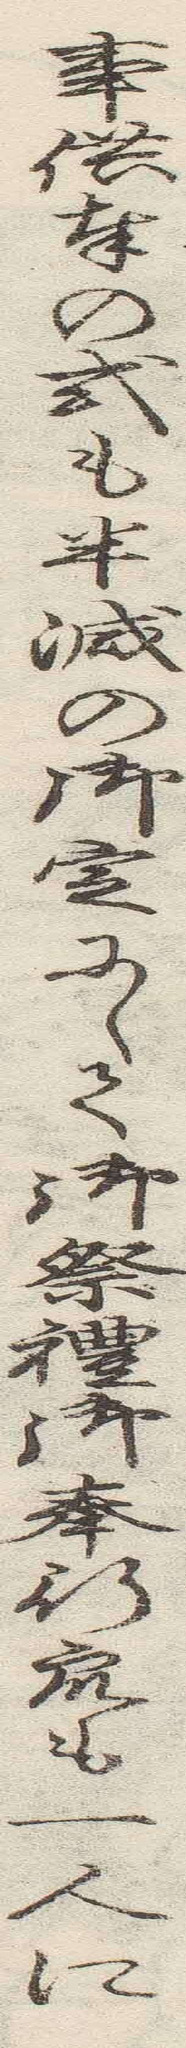事供奉の式も半減の御定にして御祭禮御奉行衆も一人に
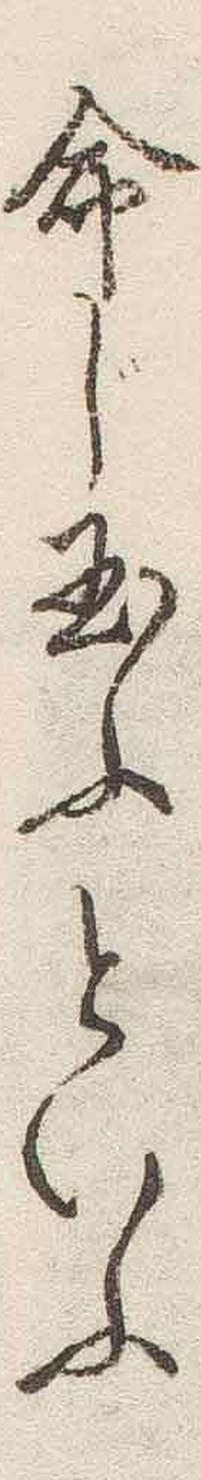命し玉ふといふ
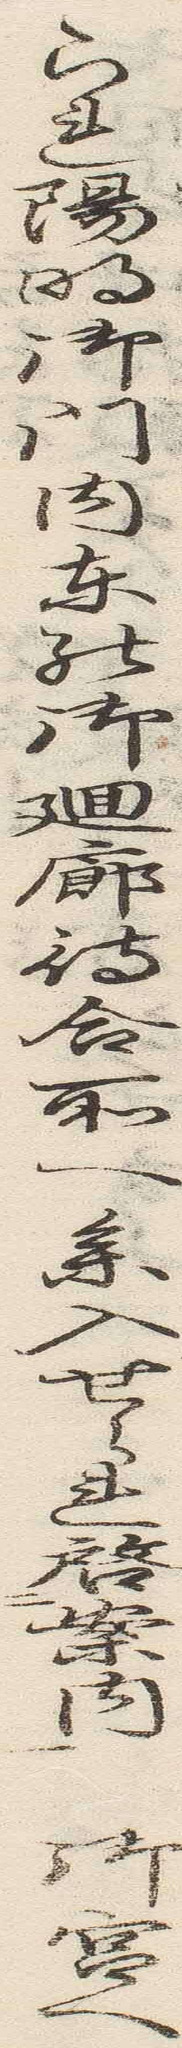られ陽明御門内東の御廽廊待合所へ参入せられ啓案内御宮へ
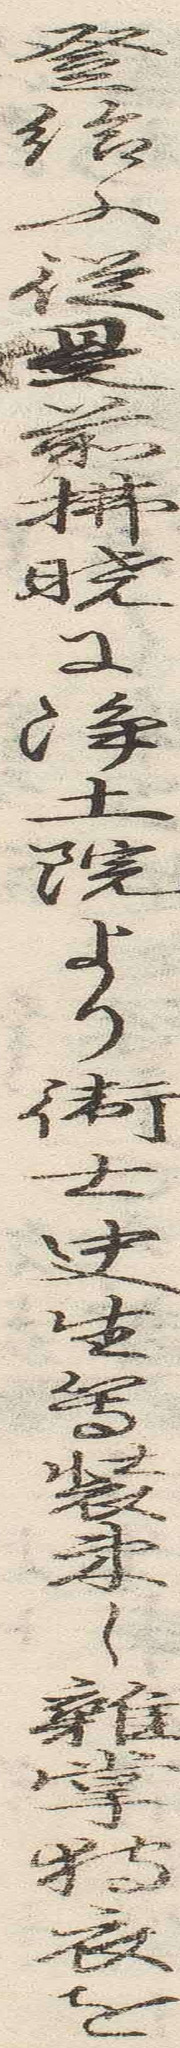登給ふ従是前拂暁に浄土院より衞士史生等装束し雜掌狩衣を
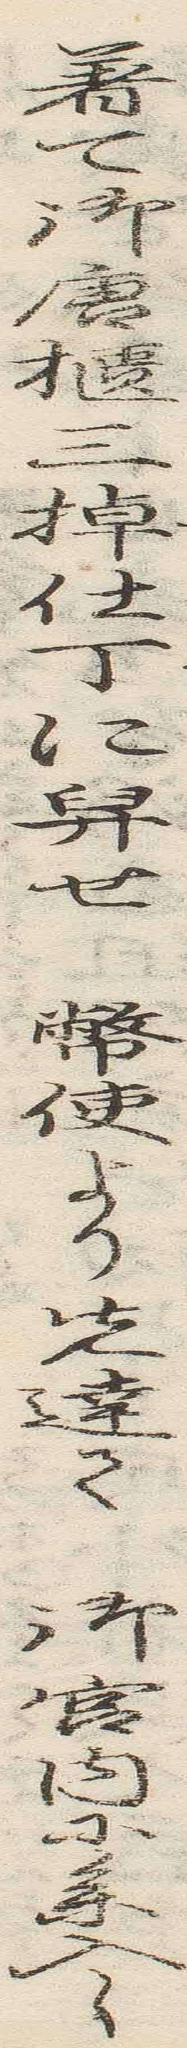着て御唐櫃三棹仕丁に舁せ幣使より先達て御宮内に参入し
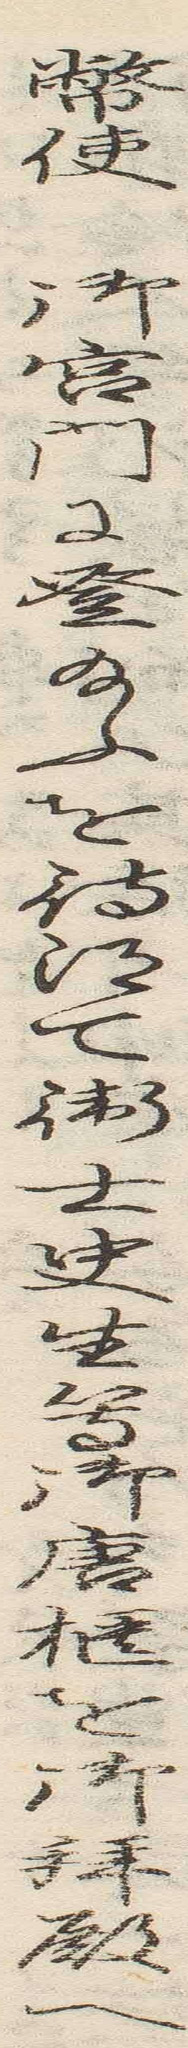幣使御宮門に登給ふを待得て衞士史生等御唐櫃を御拜殿へ
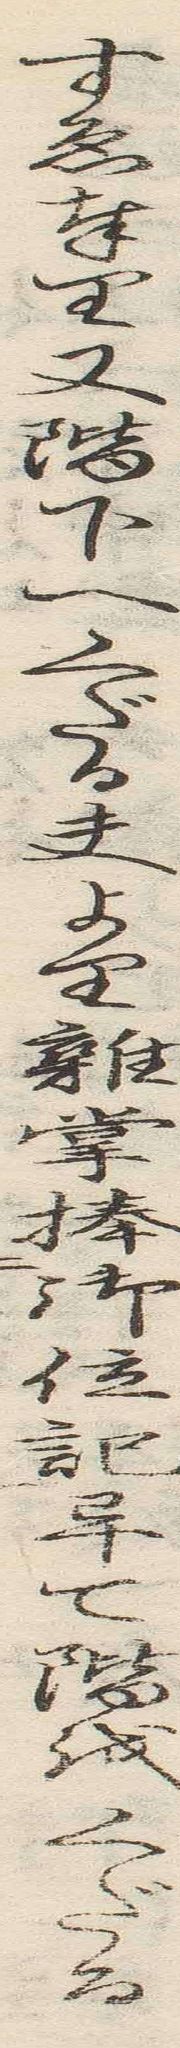すゑ奉り又階下へくだる夫より雜掌捧御位記畢て階をくだる
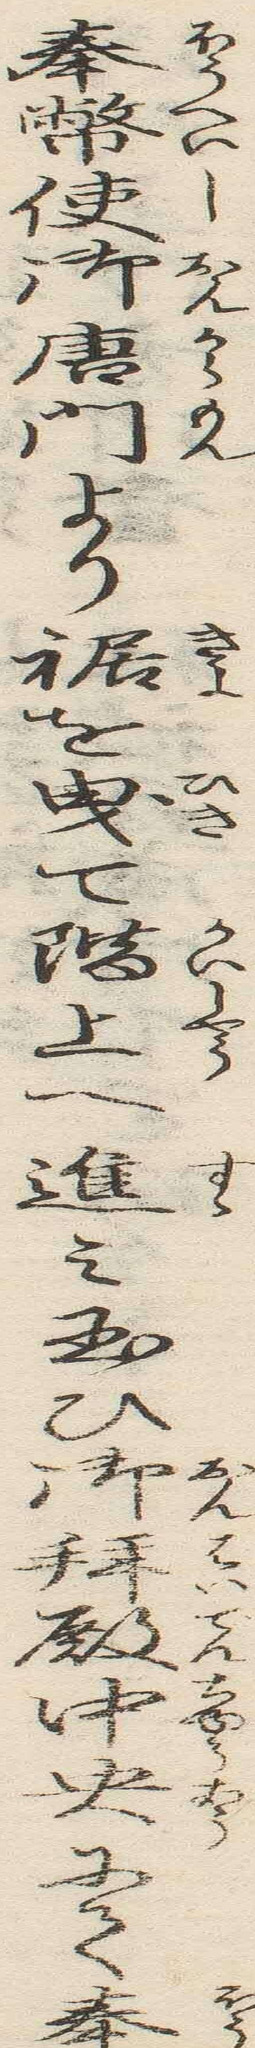奉幣使御唐門より裾を曳て階上へ進み玉ひ御拜殿中央にて奉
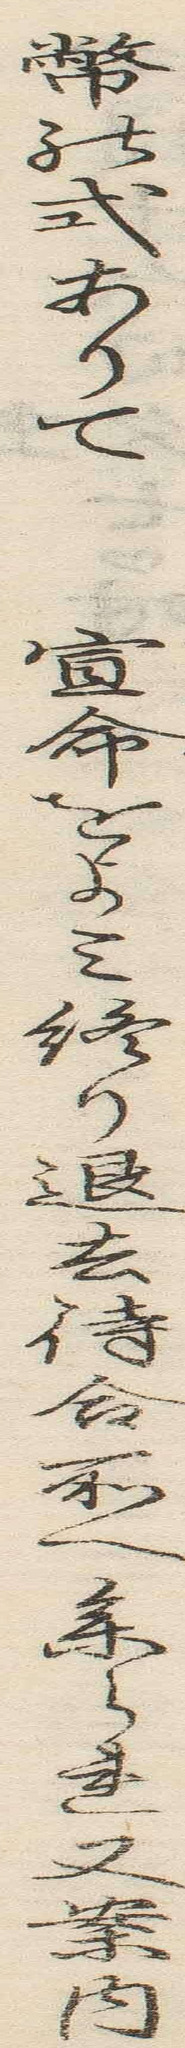幣の式ありて宣命をよみ終り退去待合所へ参られ又案内
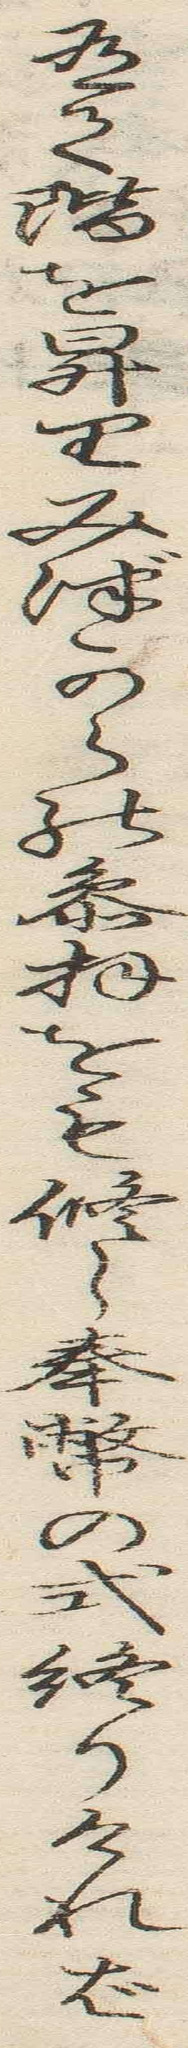有て階を昇りみづからの参拝をも修し奉幣の式終りければ
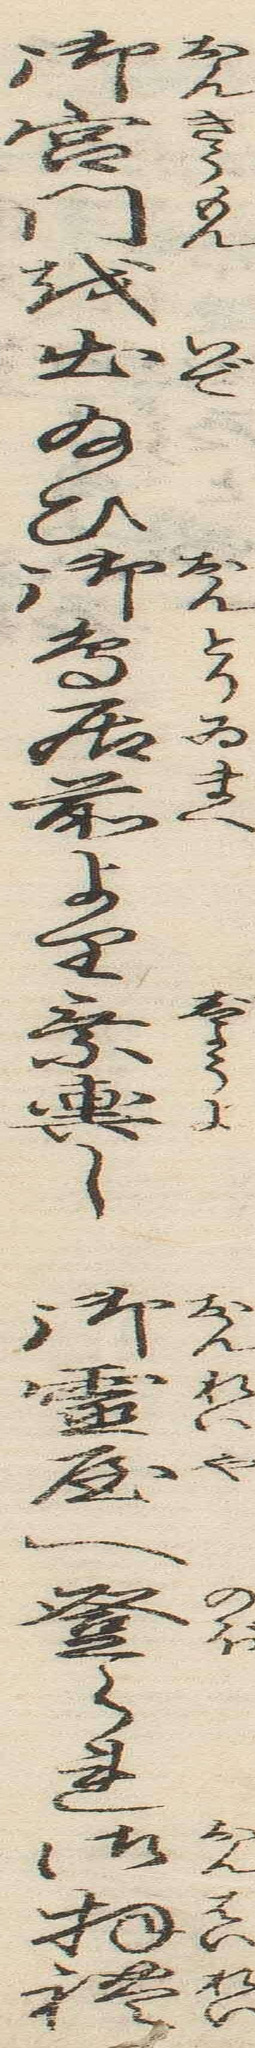御宮門を出給ひ御鳥居前より乗輿し御靈屋へ登られ御拝禮
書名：日光山志
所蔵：東京学芸大学附属図書館 国文学研究資料館
